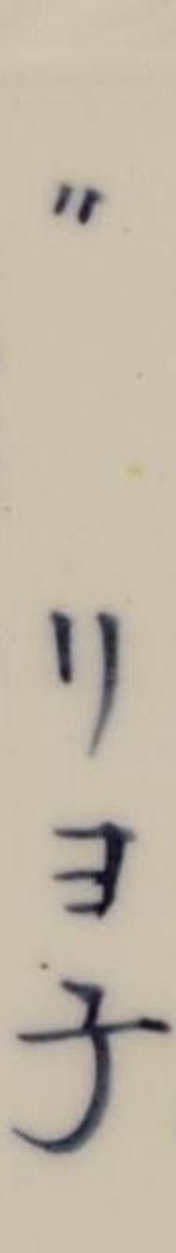リヨ子
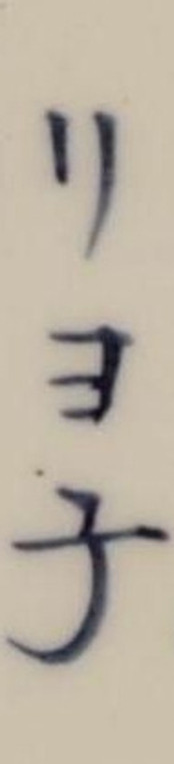リヨ子
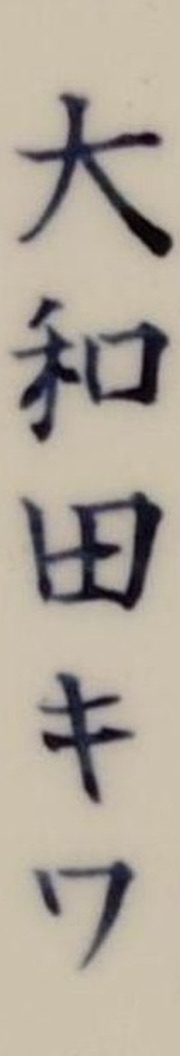大和田キワ
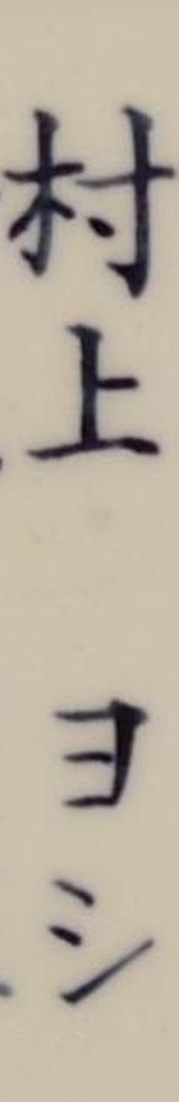村上ヨシ
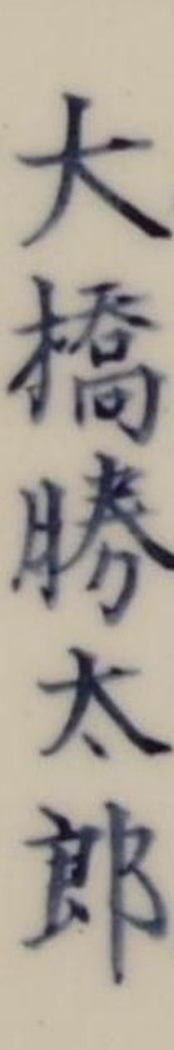大橋勝太郎
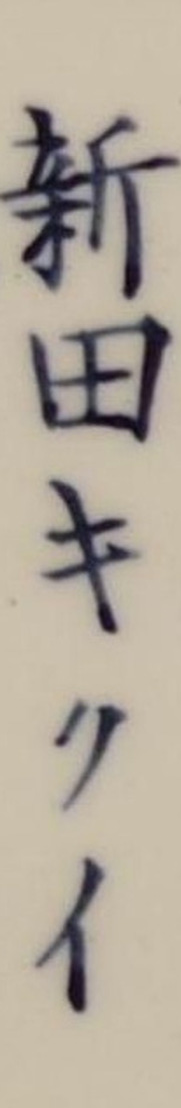新田キクイ
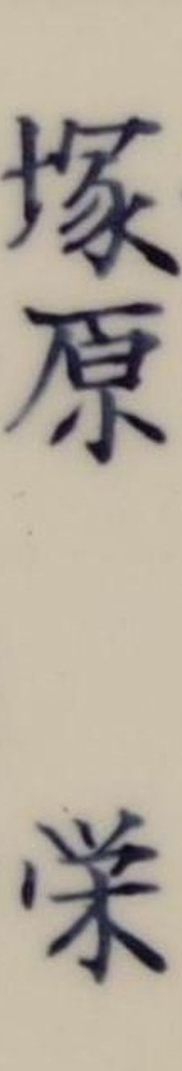塚原栄
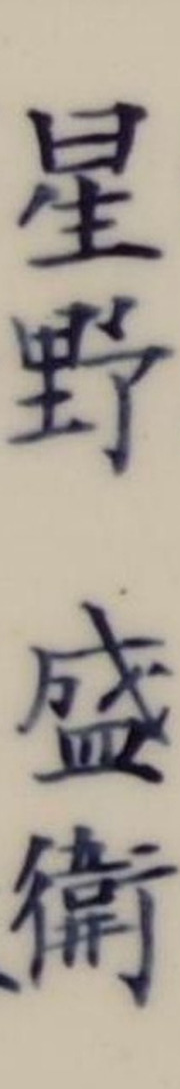星野盛衛
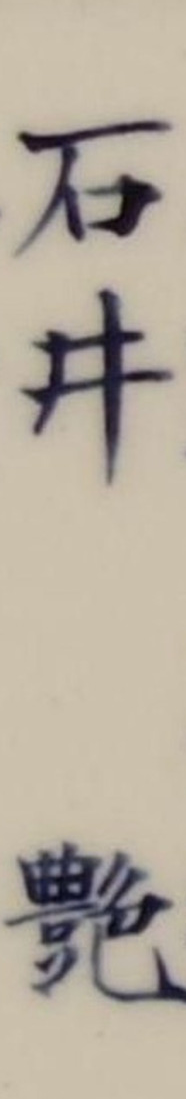石井艶
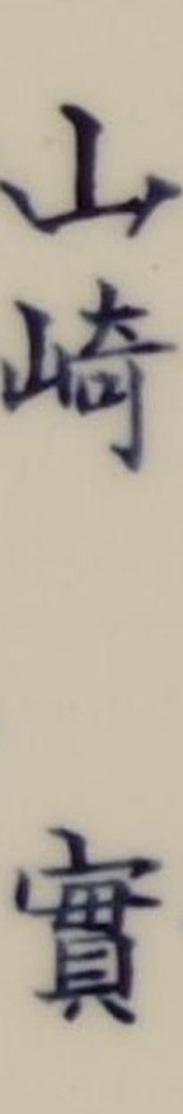山崎実
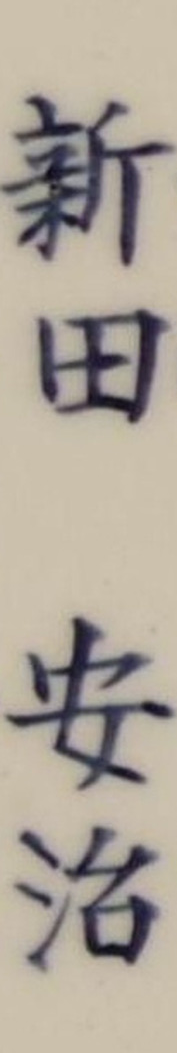新田安治
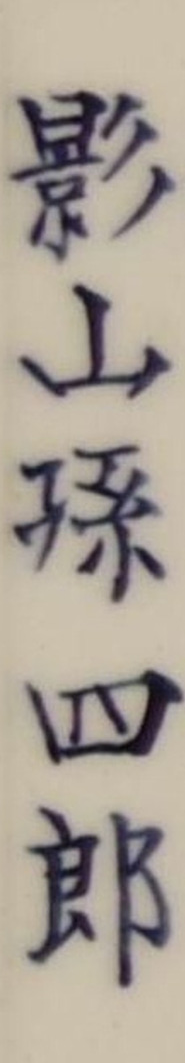影山孫四郎

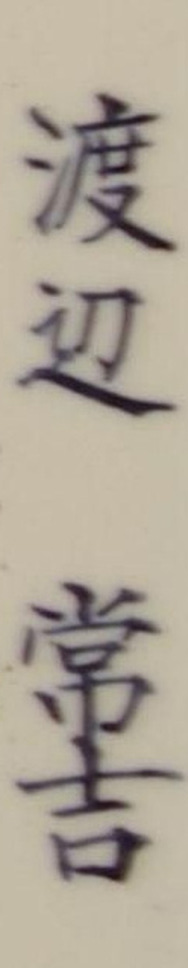渡辺常古
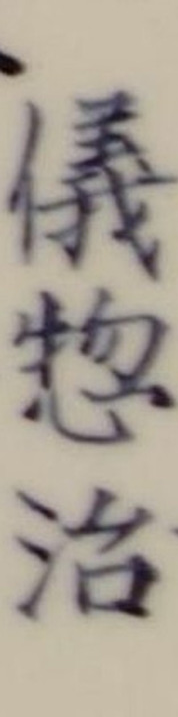儀惣治
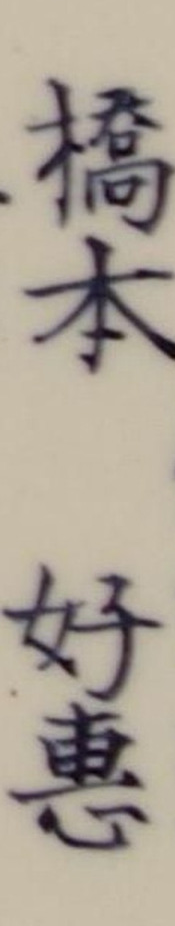橋本好恵
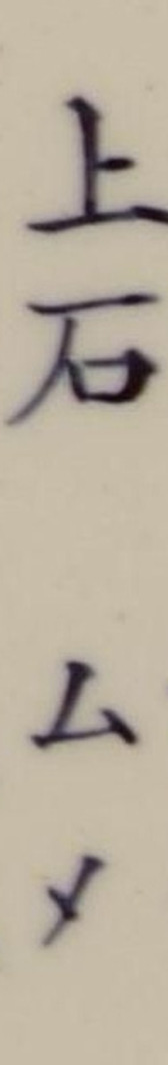上石ムメ
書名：E~L
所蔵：高野山金剛峯寺
